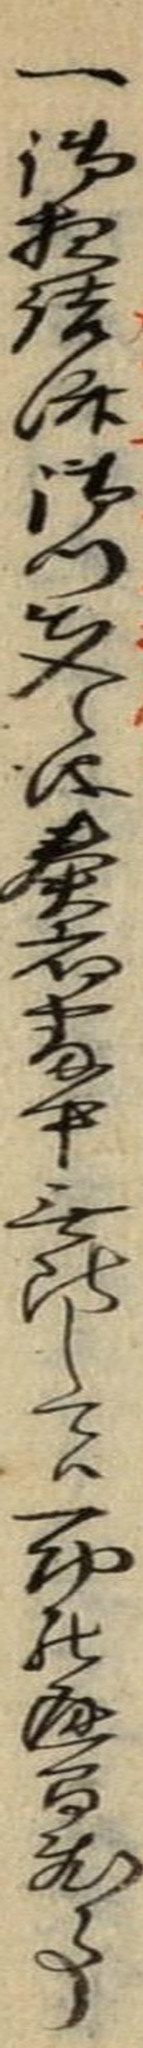一御夜詰済御門出入之儀奏者番中無断しては一切罷通間敷事
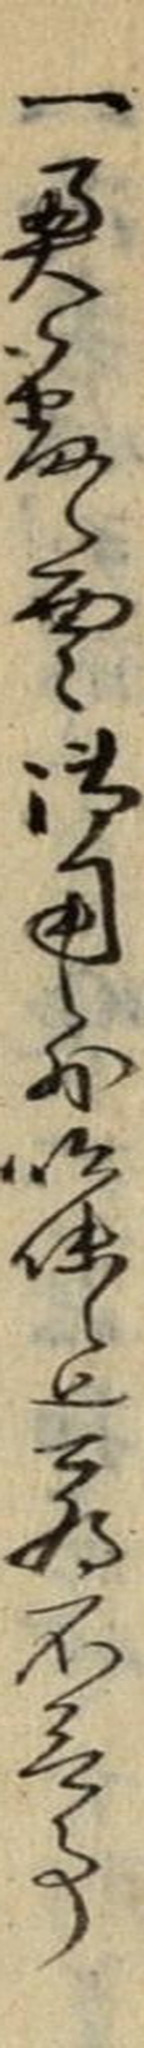一奥御番之面々御用之外吟味之上可為不参事
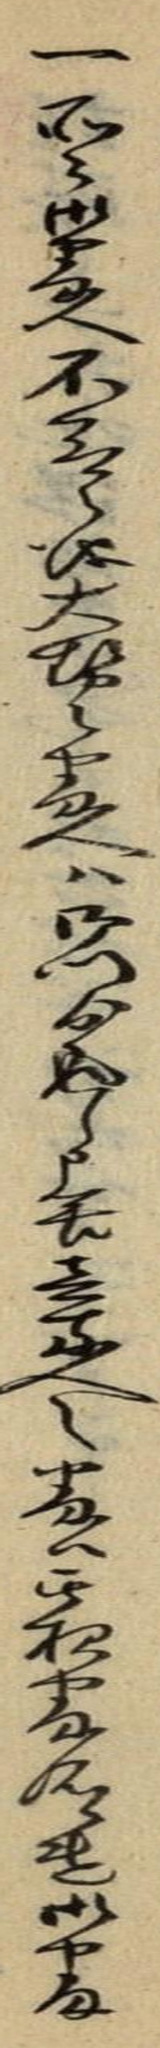一所々御番人不参之儀大勢之番人は御門ゟ返し申筈壱両人之番は其夜番所へ遣御番
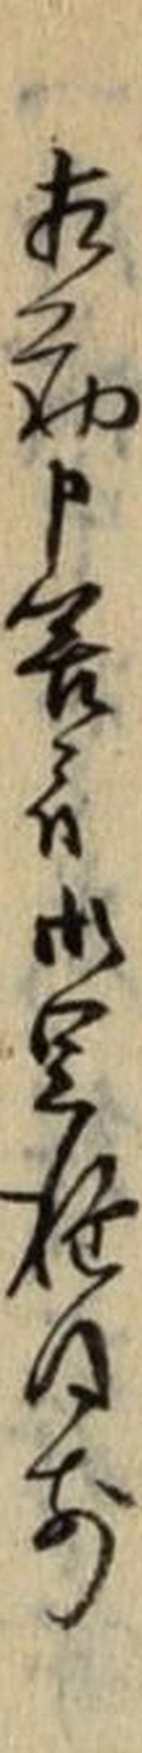相勤申筈に付御足軽同前
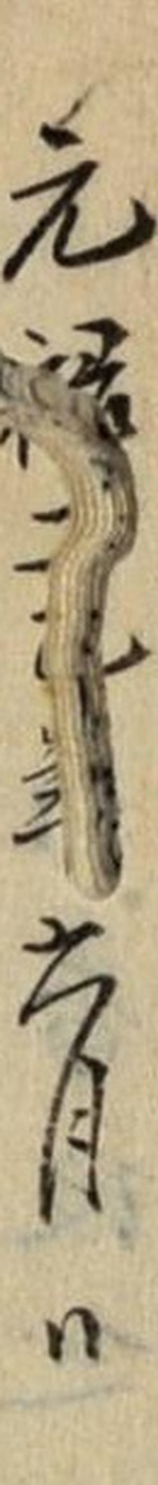元禄二巳年六月日
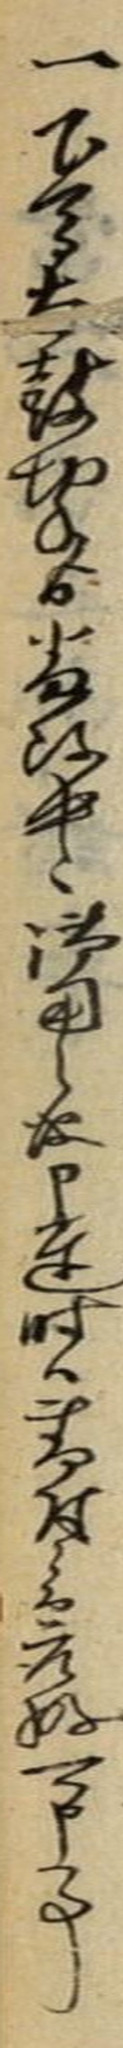一下馬太鼓切手ゟ番改中に御用之儀申達時は書付に而取扱可申事
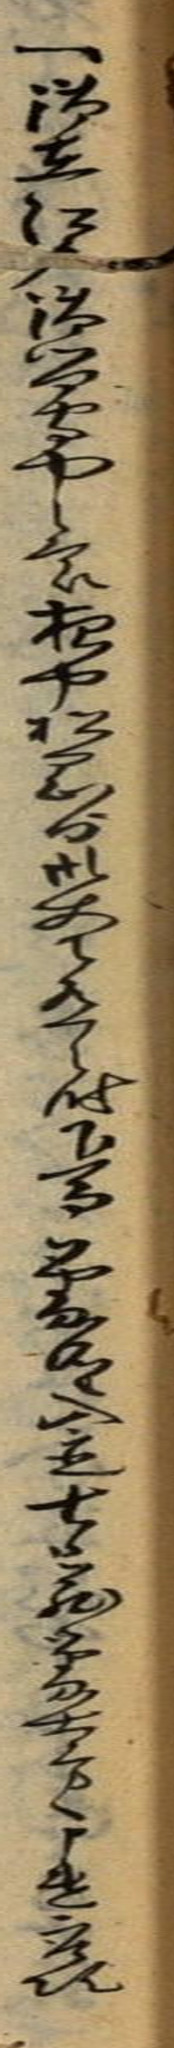一御在江戸御留守中之節夜中松岡ゟ御使者有之時下馬御番所へ入置七つ蔵御番士方へ申遣取次
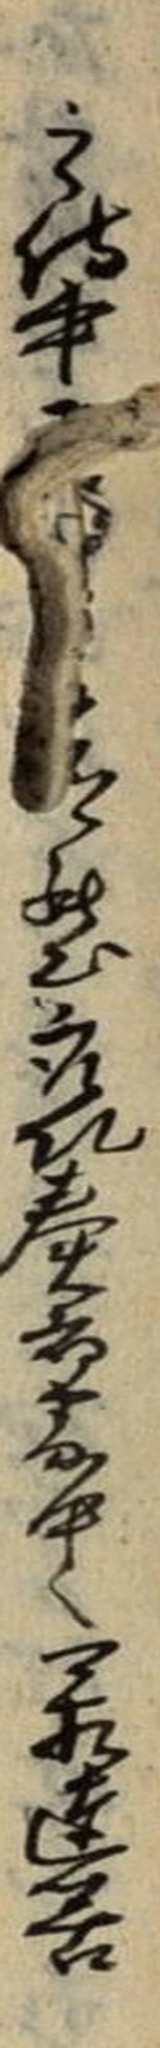之侍中へ罷出取次奏者番中へ可相達筈
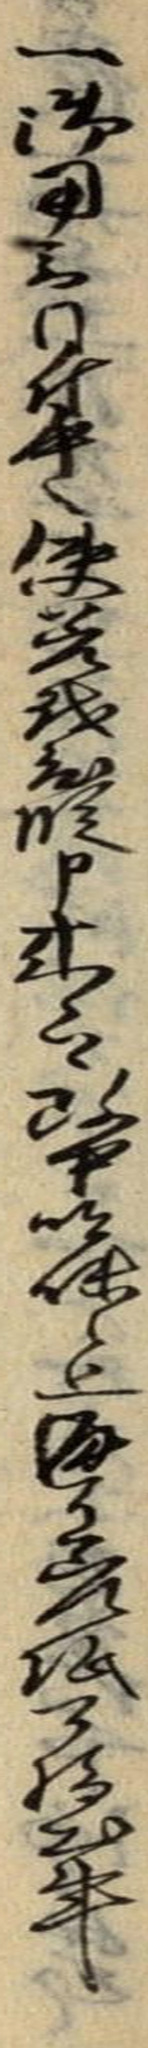一御用に而目付中へ使差越度段申来候はゝ改而吟味之上通り差紙可指出事
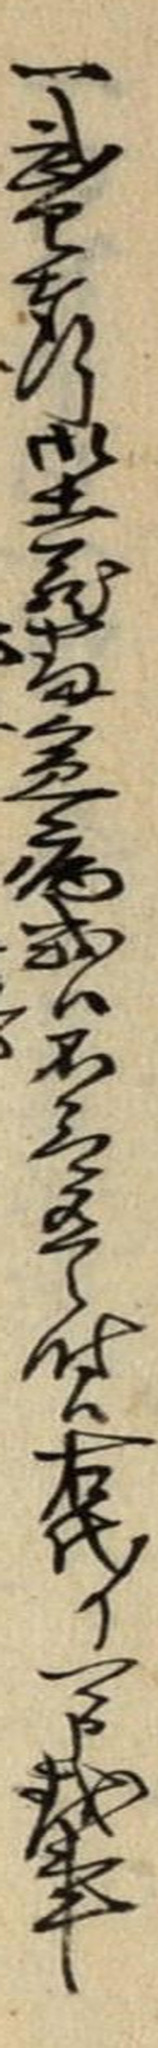一武具奉行御土蔵番急病或は不参に有之候時は右代り可申越事
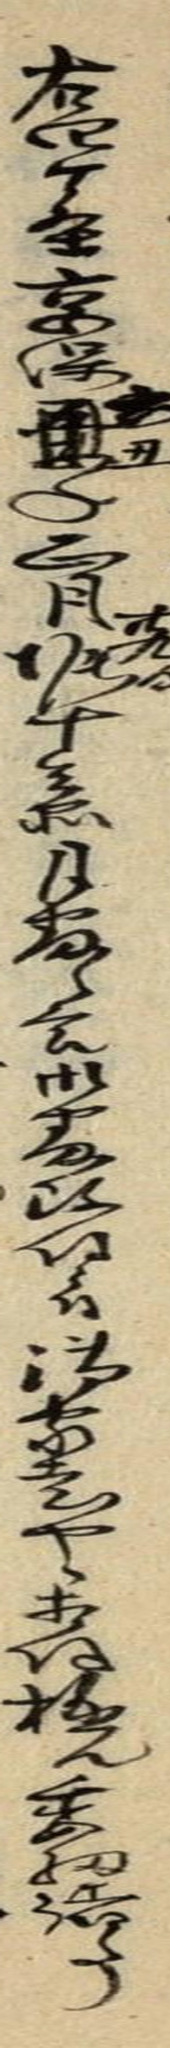右四ヶ条享保六丑年正月廿九日堀十兵衛月番之節御番改伺に付御家老中へ相伺極ル委細諸事
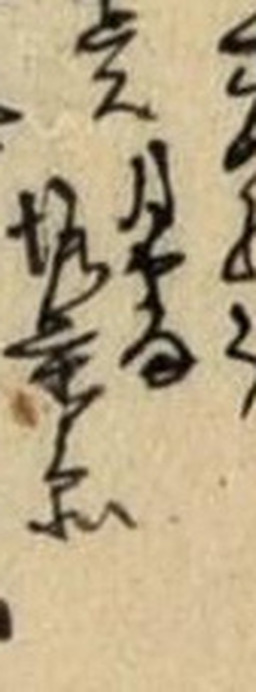堀重兵衛
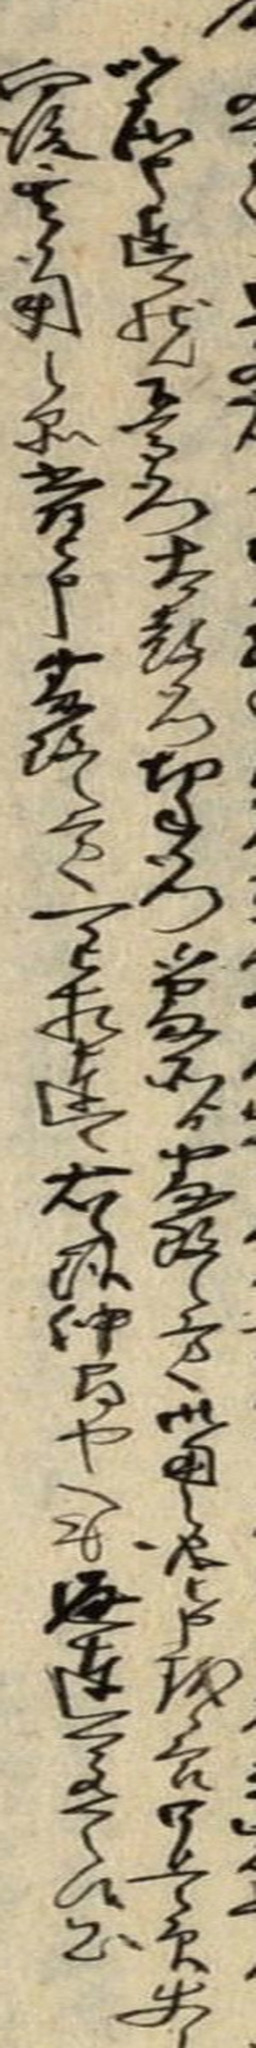向後其御用之品書付被申番改之方へ可被相達候右之趣仲間中へも通達可有之候以上
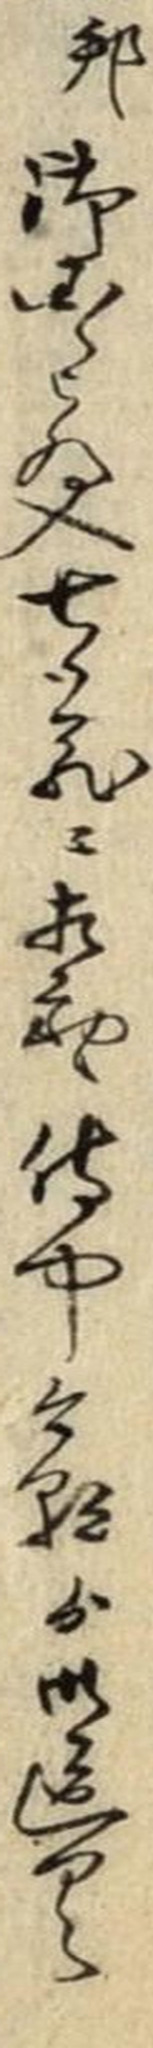公御国へ被為入七ッ蔵に相勤候侍中今朝ゟ御道具
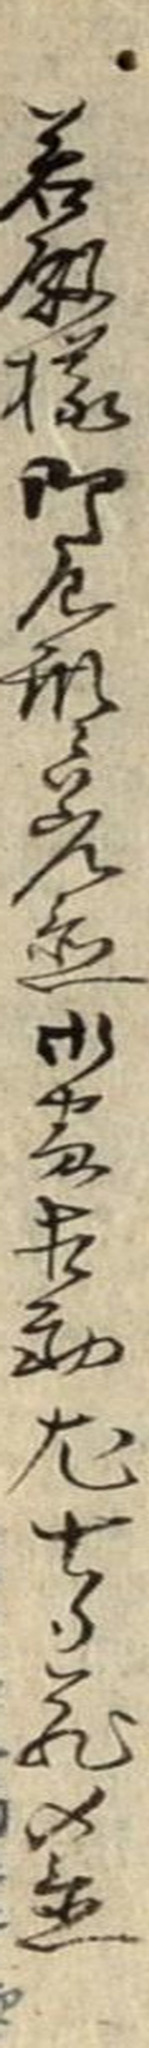若殿様御屋形に差置御番相勤尤七ッ蔵〆置
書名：蒐輯之部
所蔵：福井県文書館 Fukui Prefectural Archives
